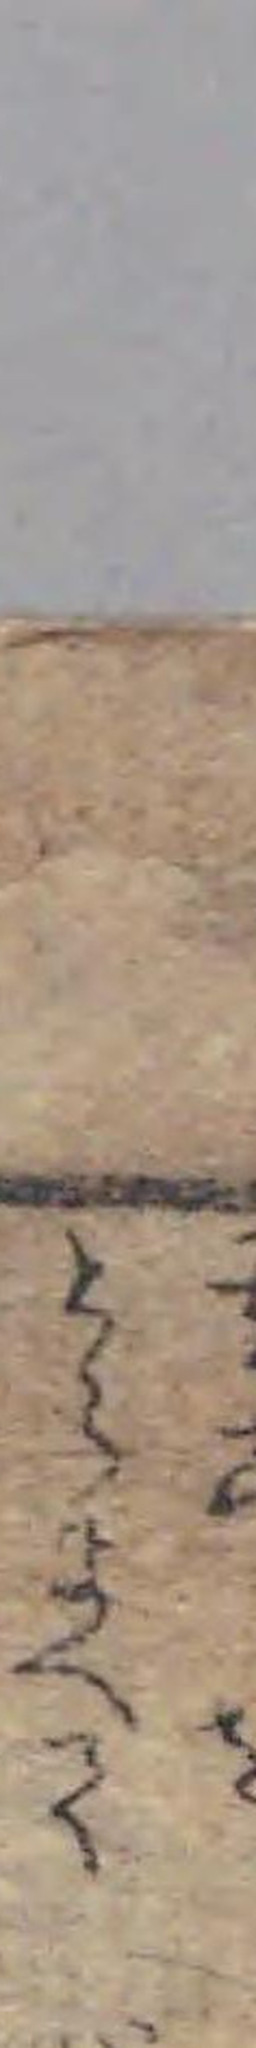とらまへて
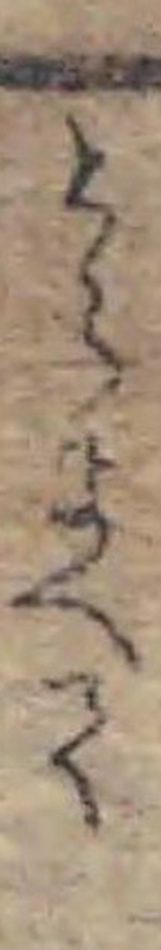とらまへて
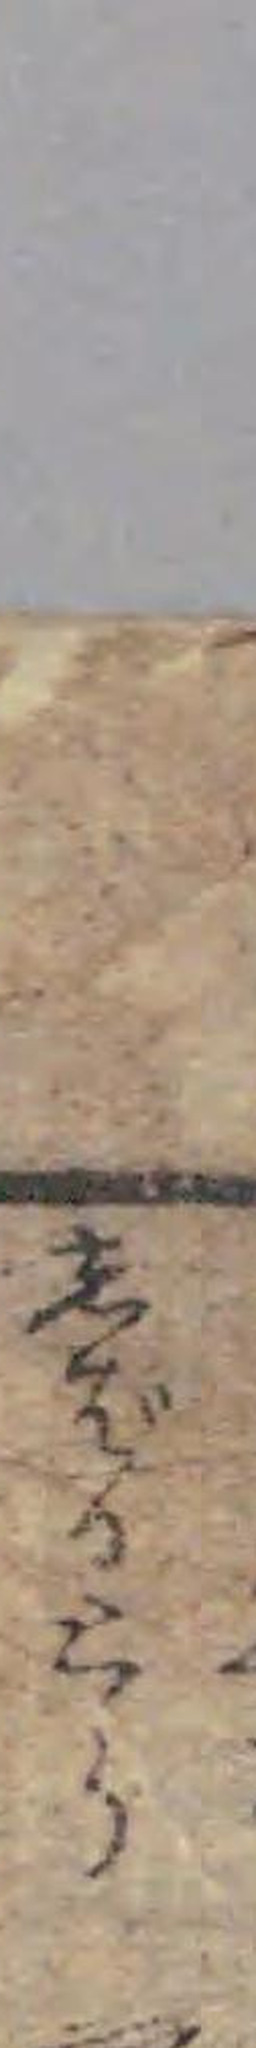しばるとら
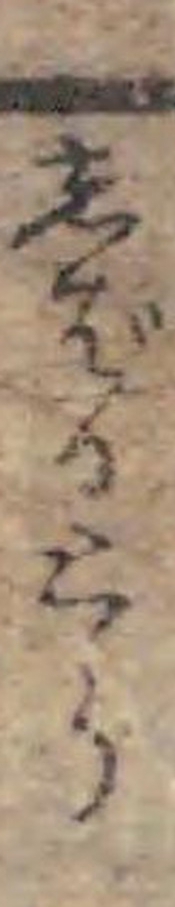しばるとら
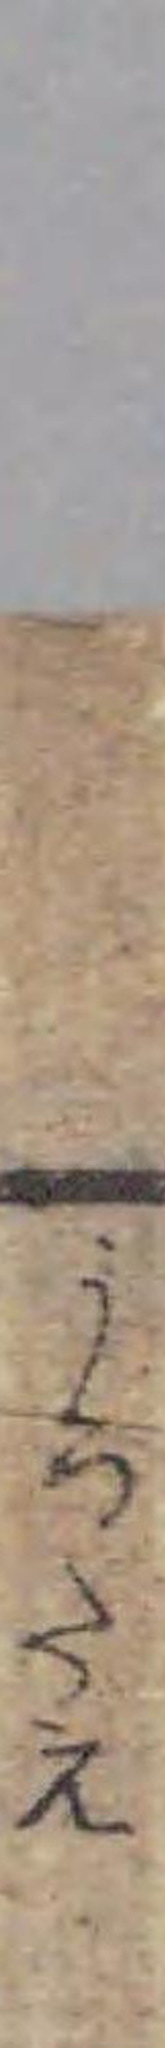うろたえ
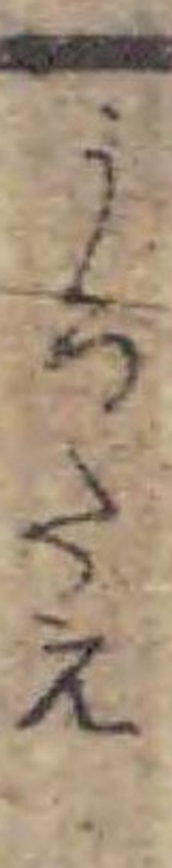うろたえ
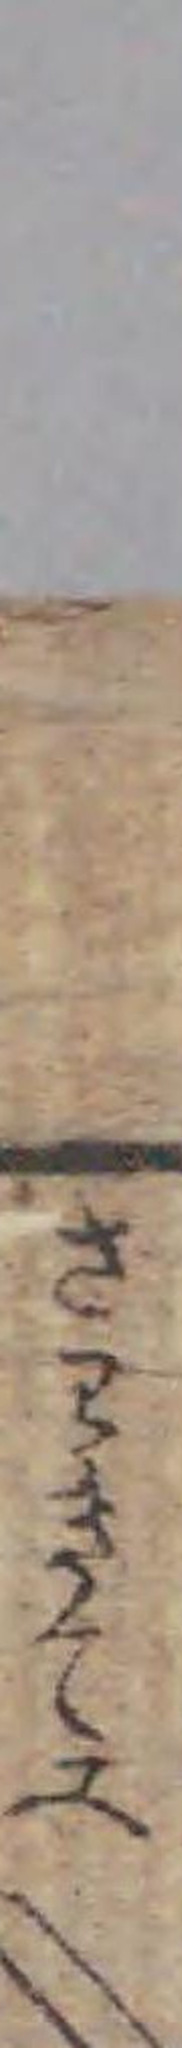さわきて又
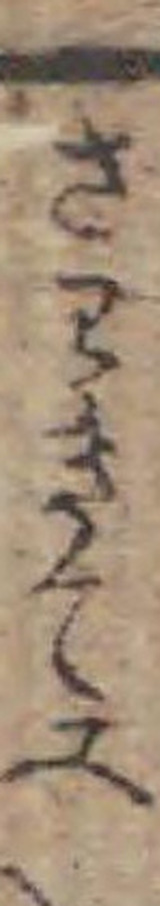さわきて又
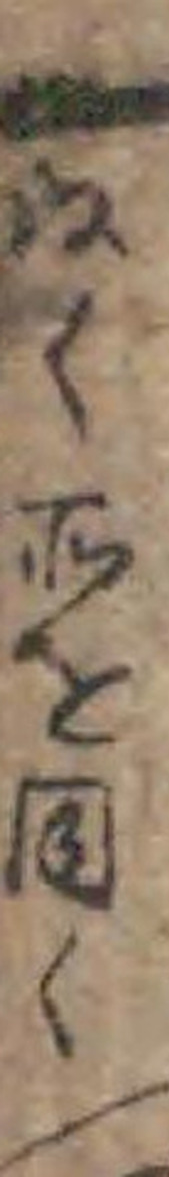ぬく所を同く
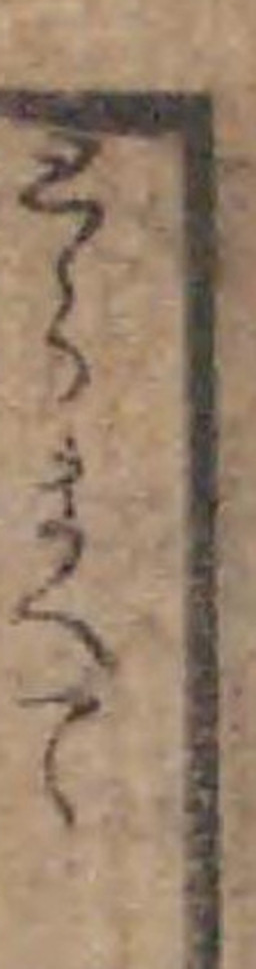とらまへて
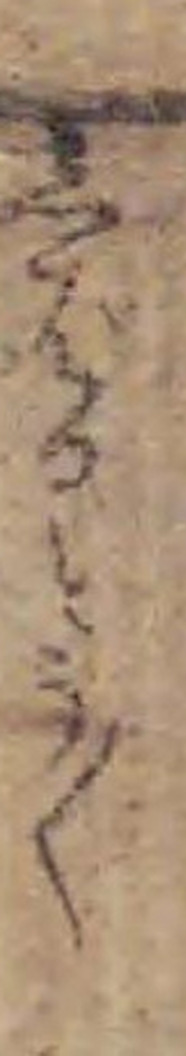しばるとう〳〵
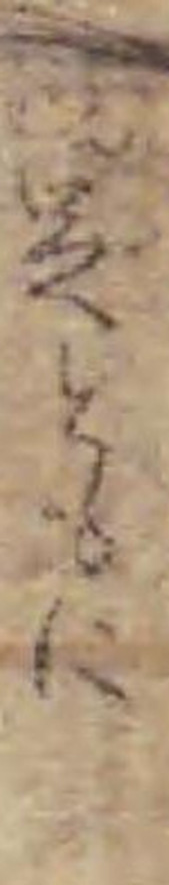両足ともに
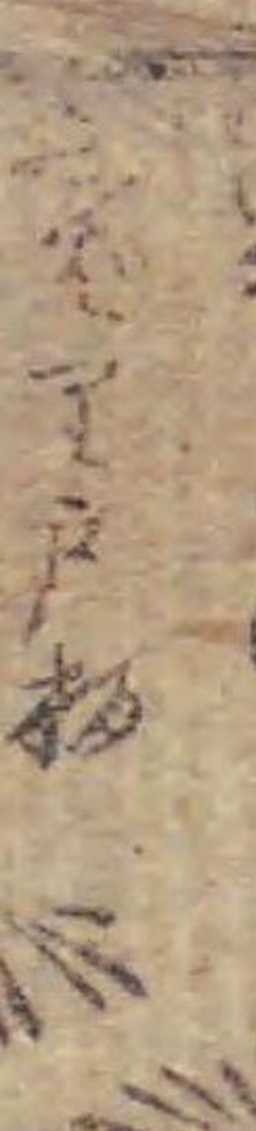しばり戸板
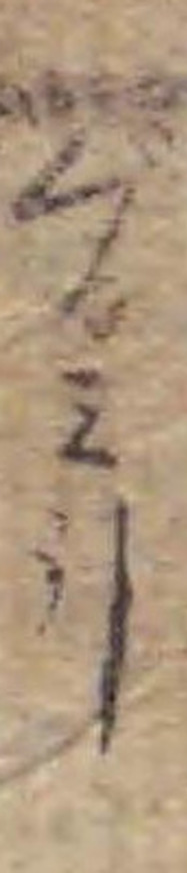ぐるみ引
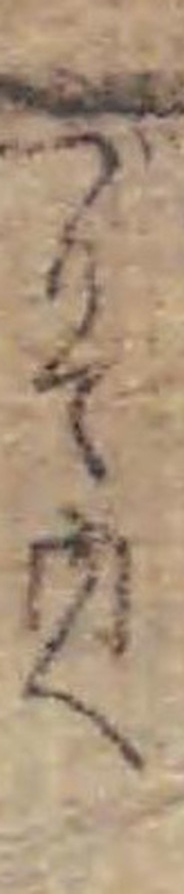づりて内へ
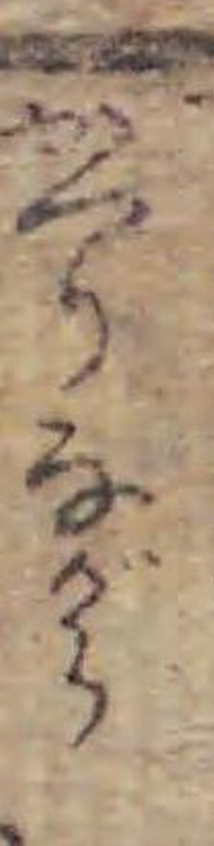かへりながら
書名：虚言八百万八伝 : 3巻
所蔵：国立国会図書館 National Diet Library, JAPAN
